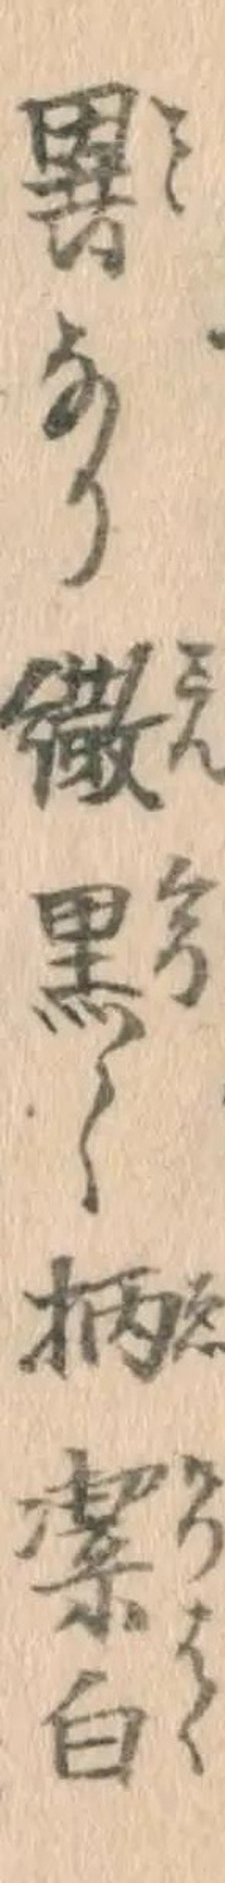異なり繖黒く柄潔白
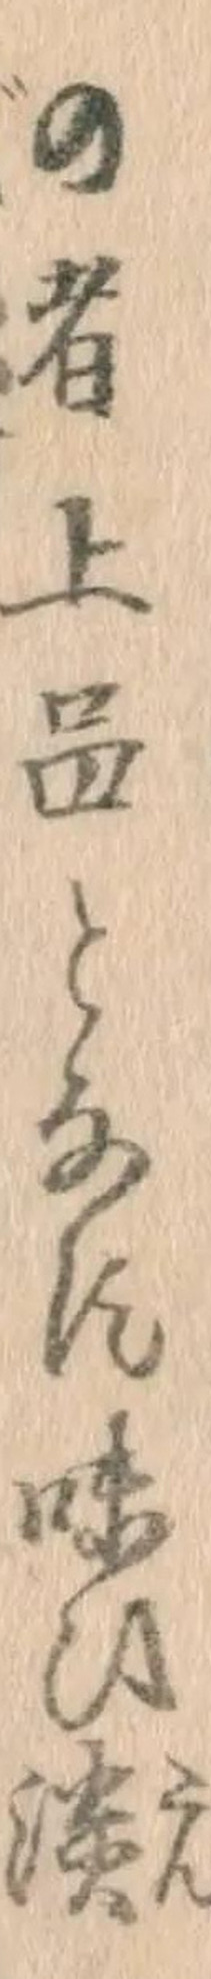の者上品となす味ひ淡
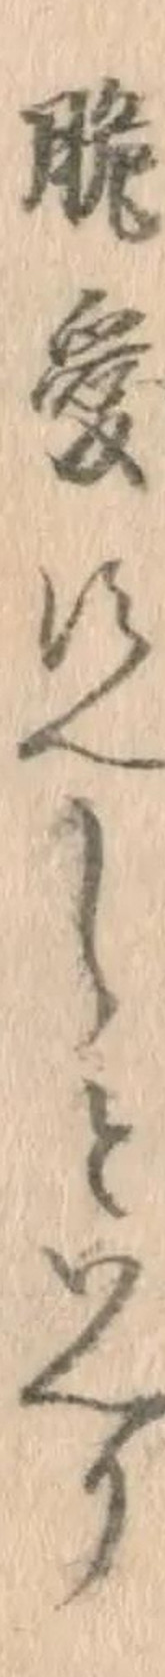脆愛すへしといへり
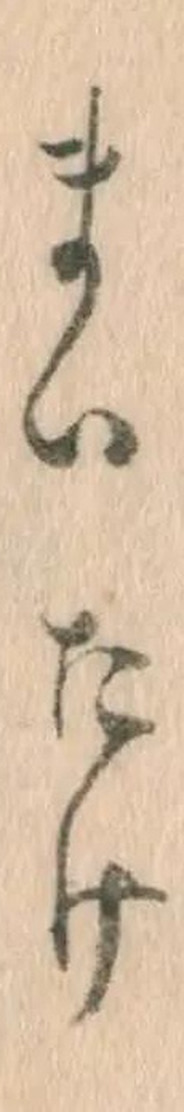まいたけ
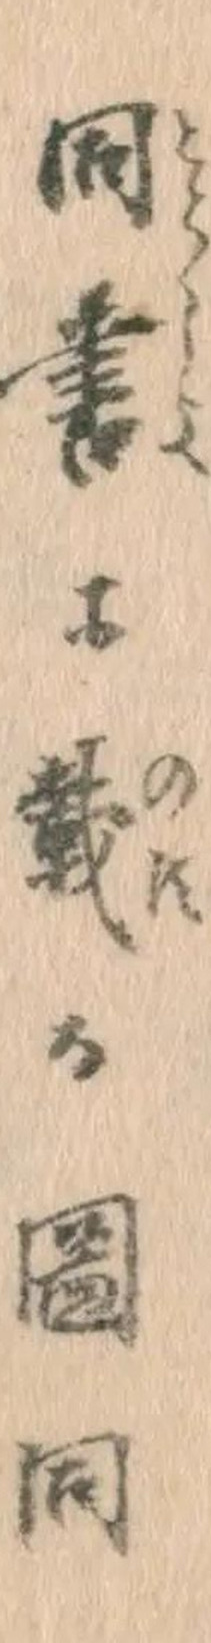同書に載る図同
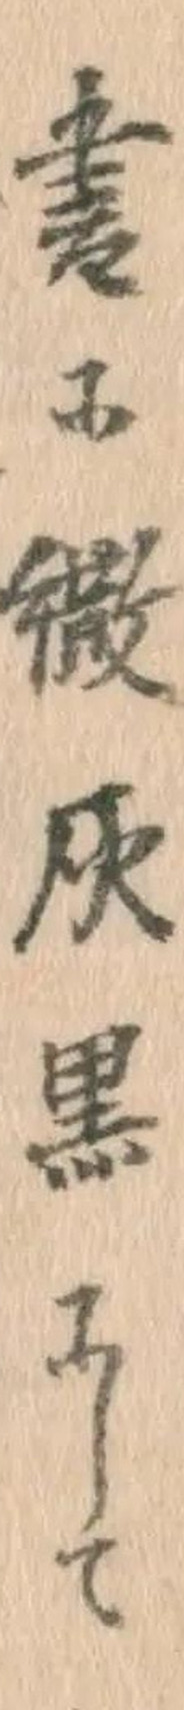書に繖灰黒にして
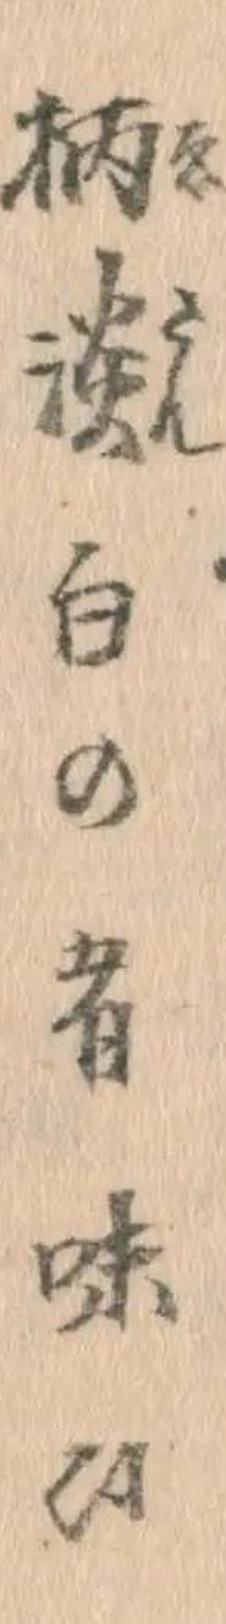柄淡白の者味ひ
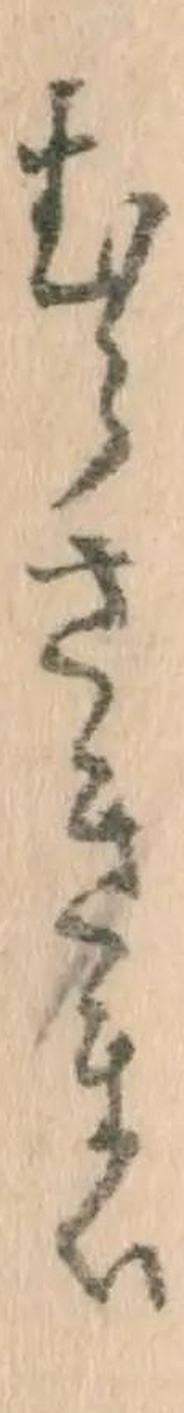むらさきまい
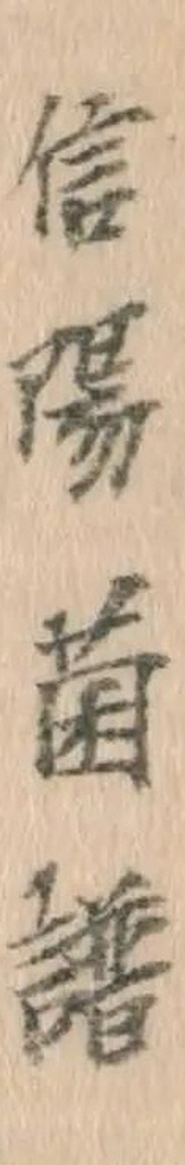信陽菌諸
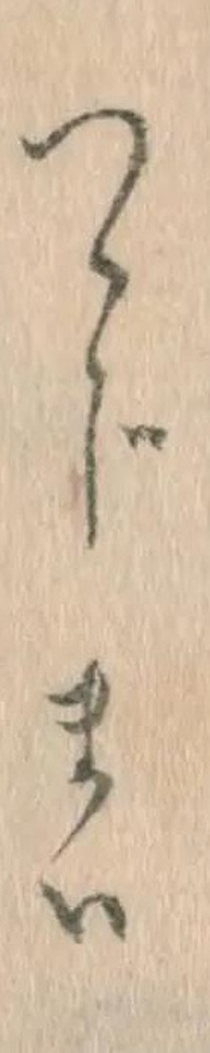つゝじまい
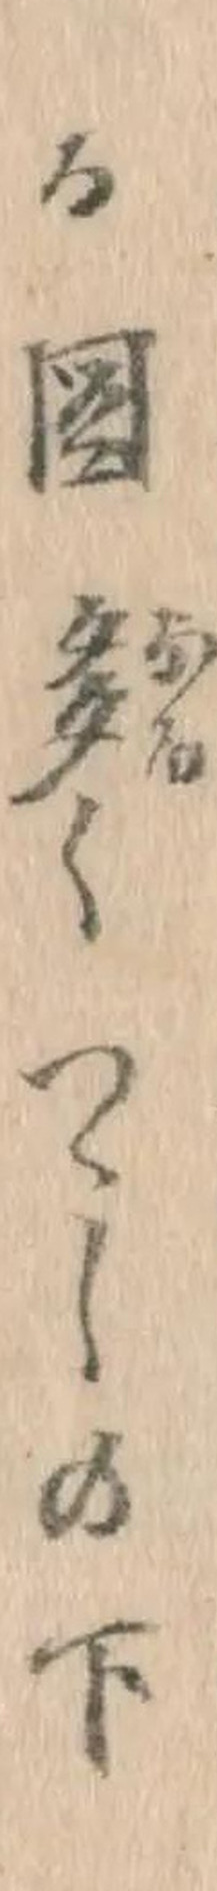る図多くつゝしの下
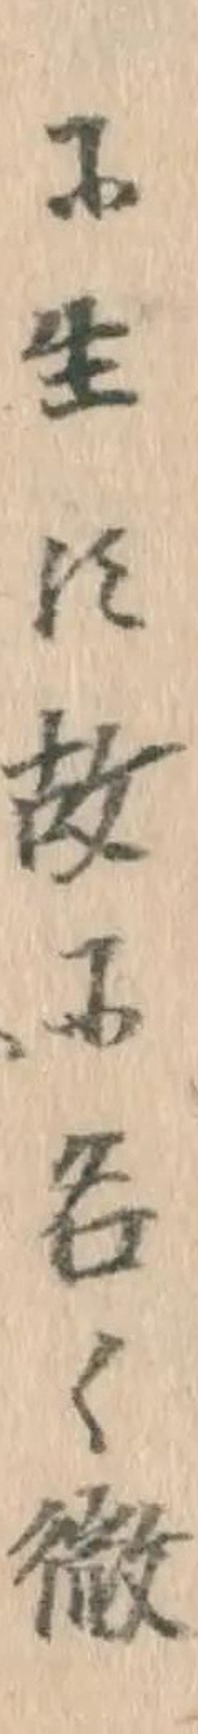に生す故に名く微
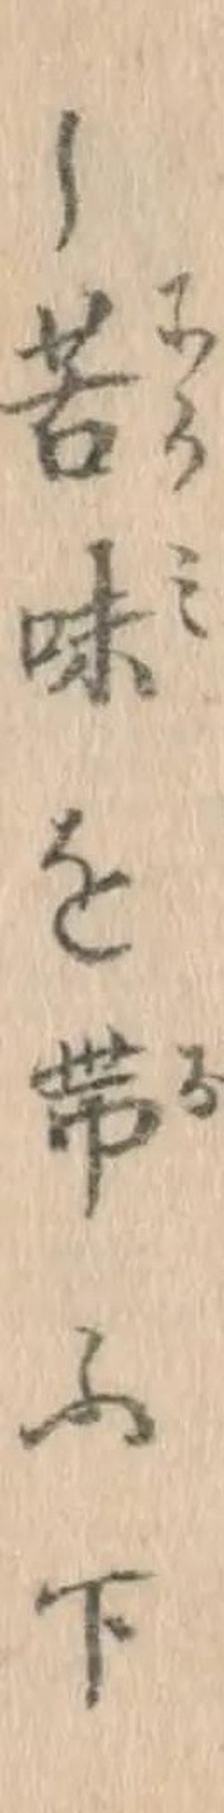し苦味を帯ふ下
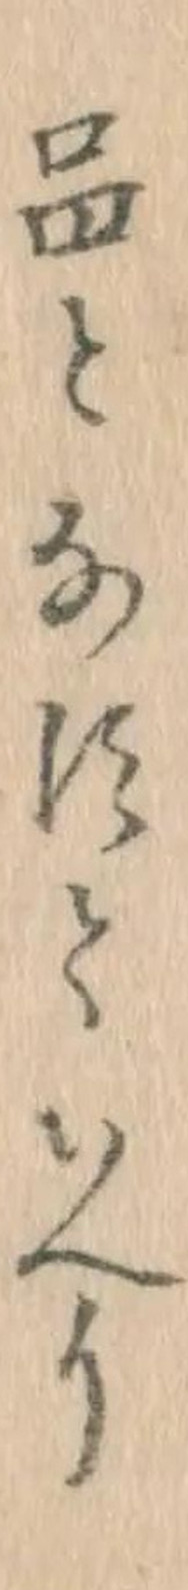品となすといへり

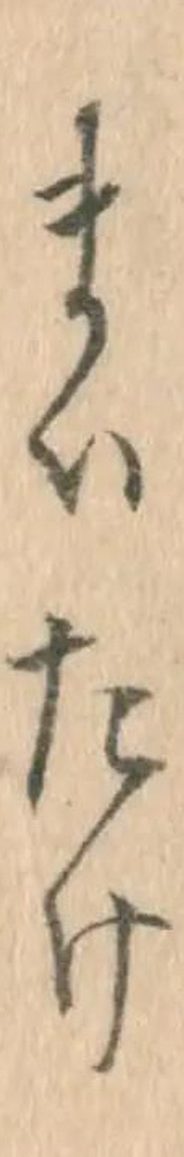まいたけ
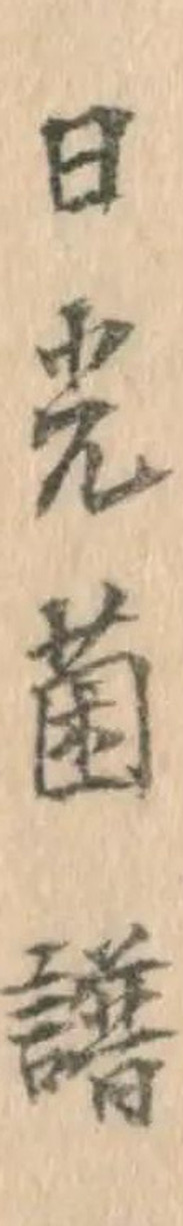日光菌譜
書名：本草図譜. 巻58-60
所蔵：国立国会図書館 National Diet Library, JAPAN
